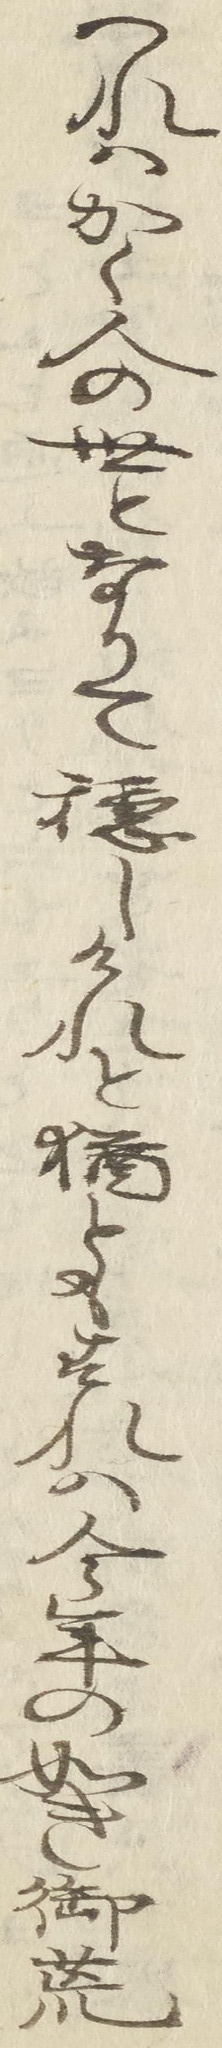つれはかく人の世となりて穏しかれと猶ともあれは今年の如き御荒
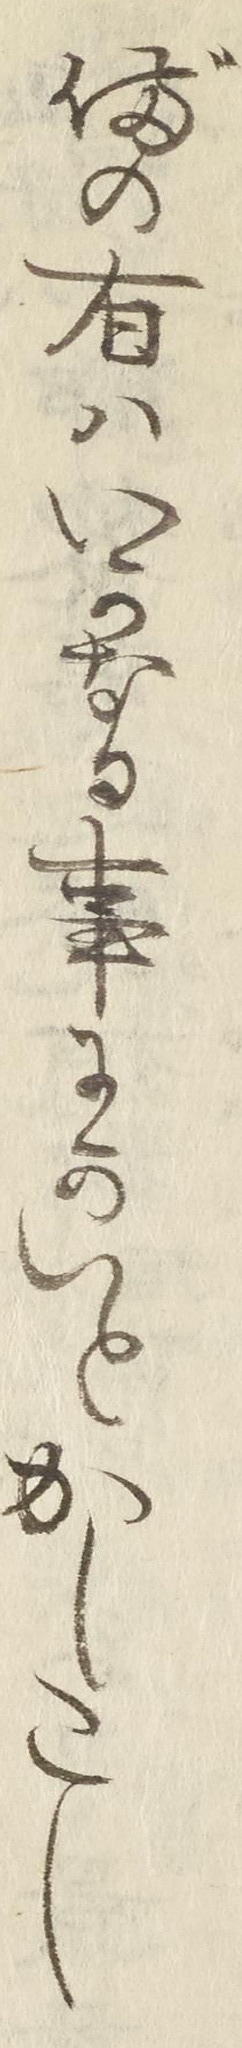備の有はいかなる事にかいとかしこし
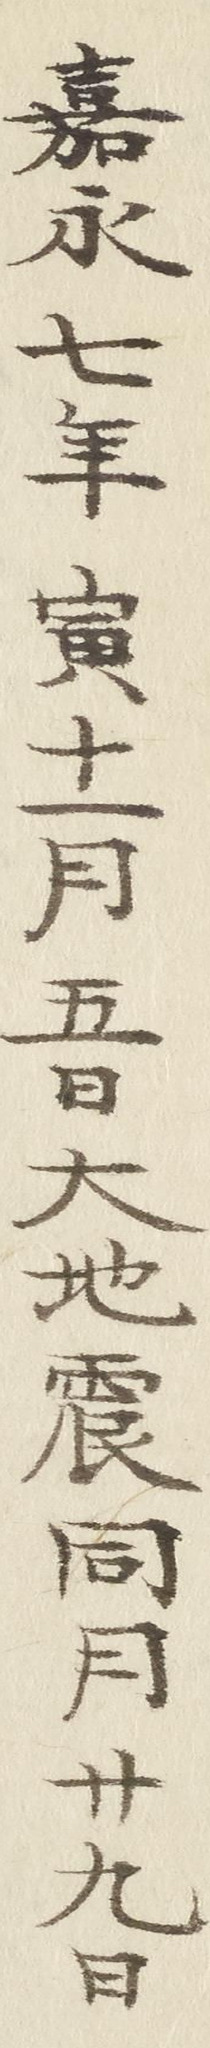嘉永七年寅十一月五日大地震同月廿九日
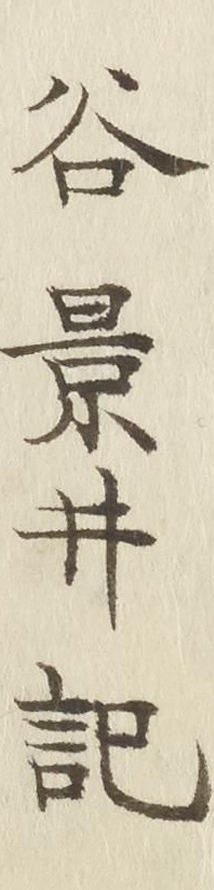谷景井記
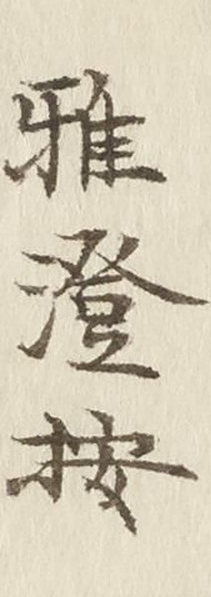雅澄按
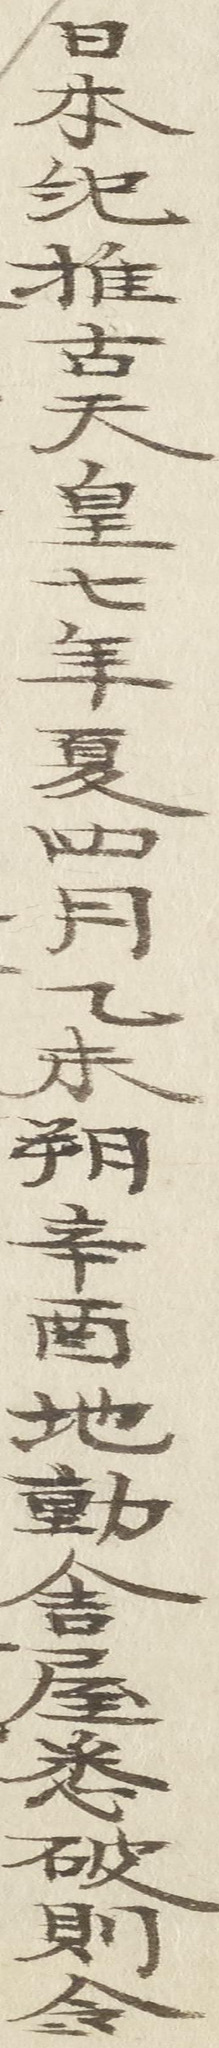日本紀推古天皇七年夏四月乙未朔辛酉地動舎屋悉破則令
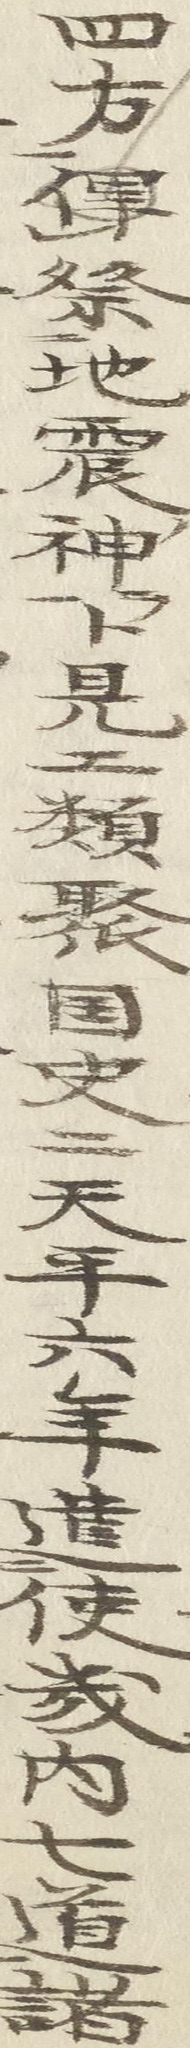四方俾祭地震ノ神ラㇳ見エ類聚国史二天平六年遣史畿内七道諸
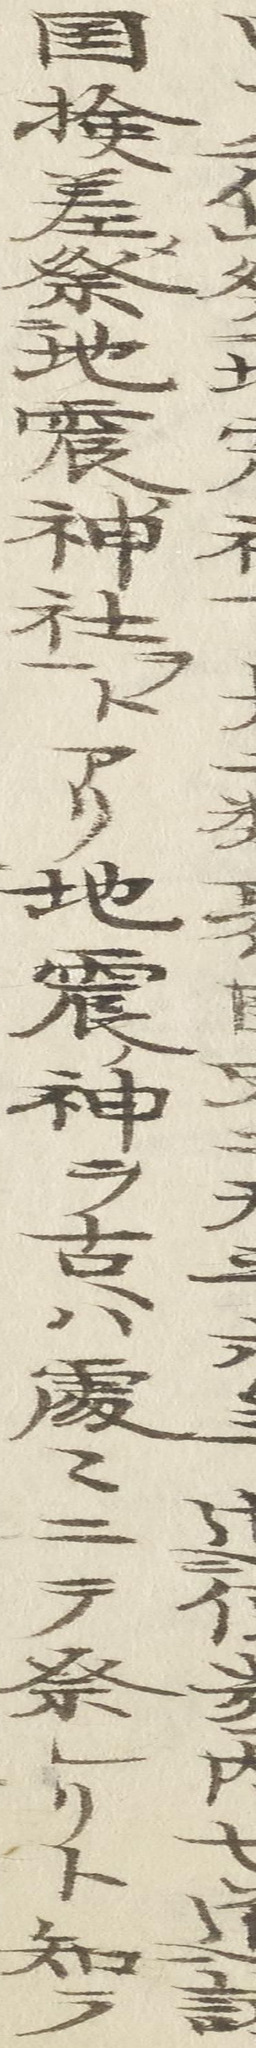国検差メ祭地震ノ神社ヲㇳアリ地震神を古へハ処々ニテ祭レリㇳ知ラ
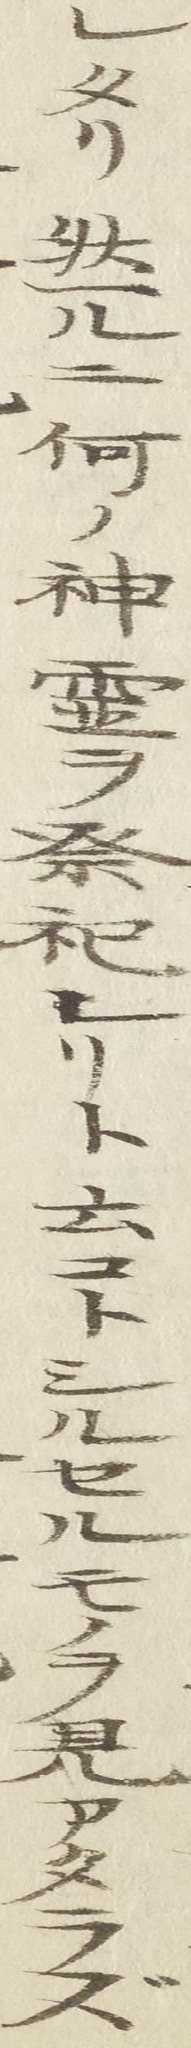ㇾタリ然ㇽ二何ノ神霊ヲ祭祀シリㇳ云コトシルセルモノヲ見アタラズ
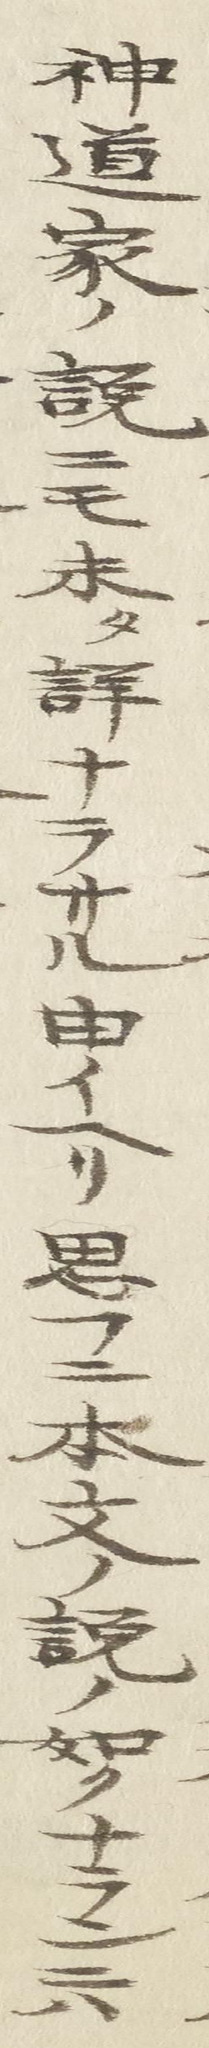神道家ノ説二モ未タ詳ナラサル由イへリ思フ二本文ノ説ノ如ㇰナラン二ハ
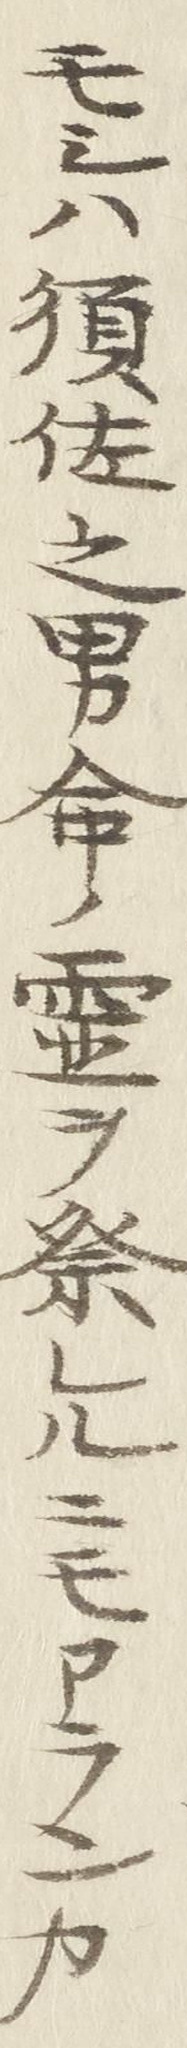モシハ須佐之男命の霊ヲ祭レル二モアランカ

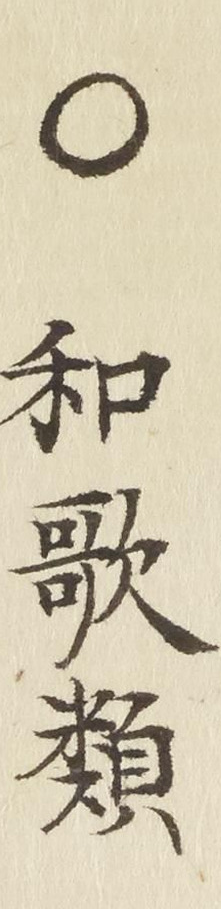〇和歌類
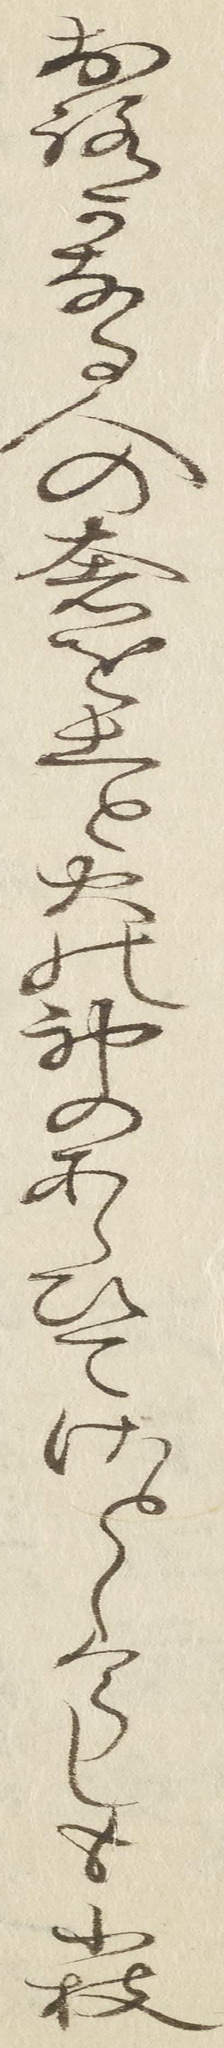おろかなる人の奢を土と火の神のあらひておとしけりしも小枝
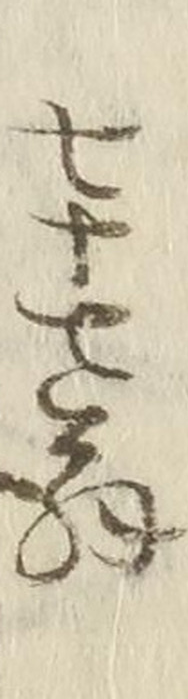七十七翁
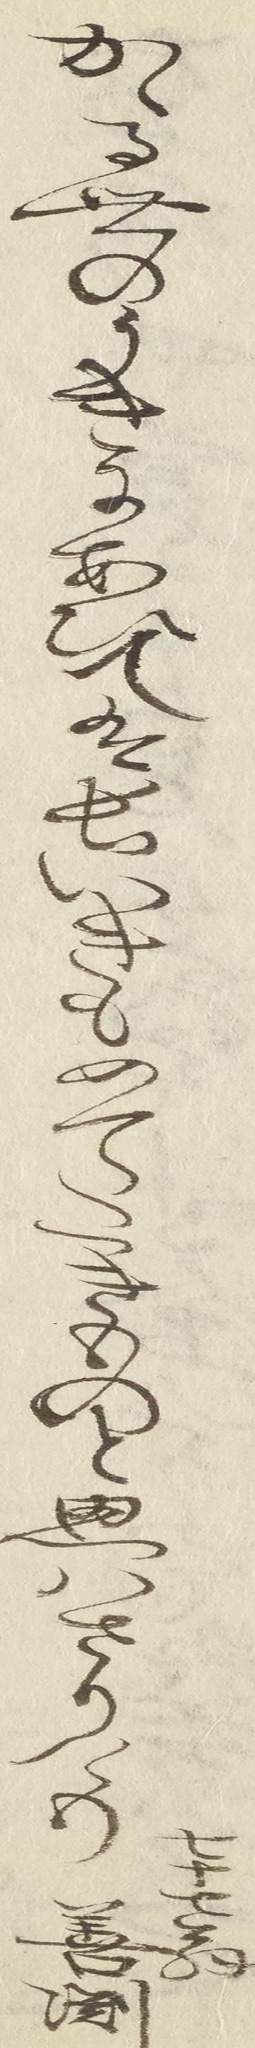かゝる世のうきにあひては長いきもめてたきものと思はさりけり善渕
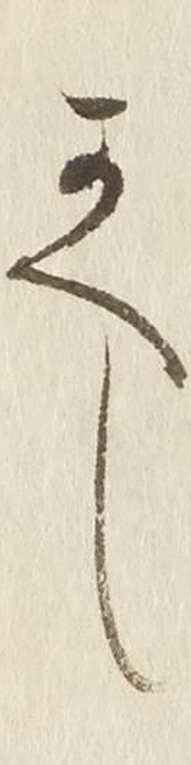かへし
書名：地震記　下
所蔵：東京大学地震研究所図書室 Earthquake Research Institute Library, The University of Tokyo, JAPAN
